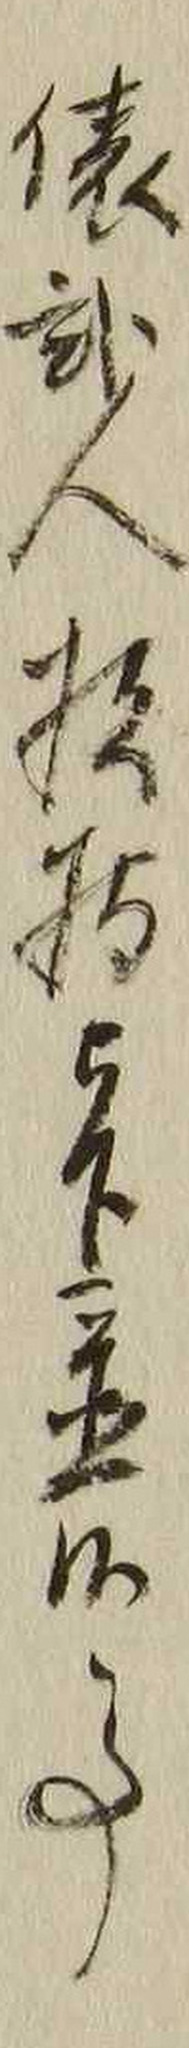俵弐人扶持被下置候事
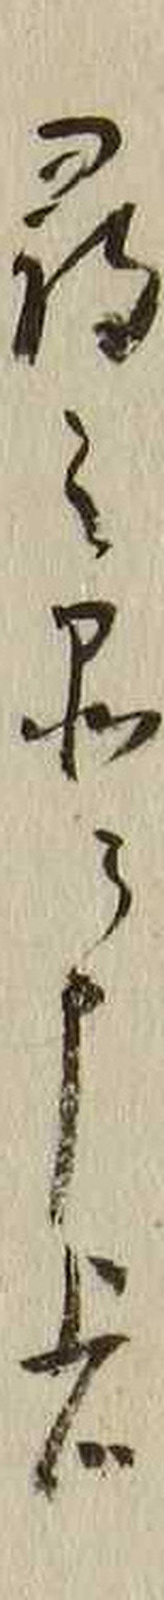尋之品々申上候
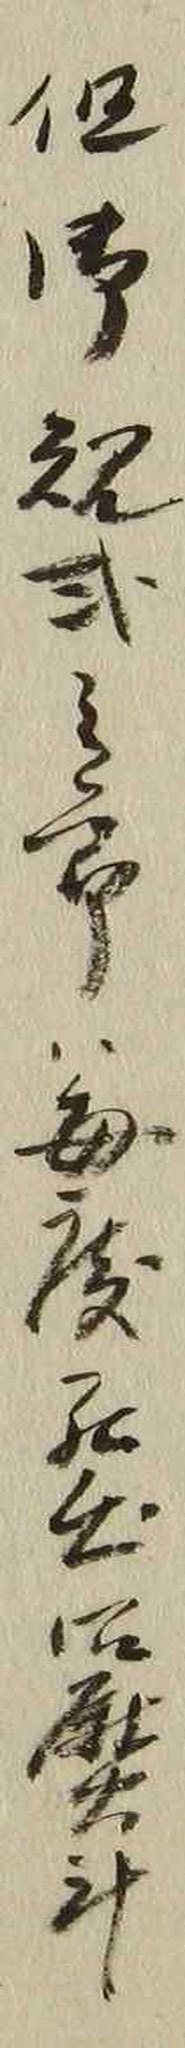但御規式之節は毎度罷出御熨斗
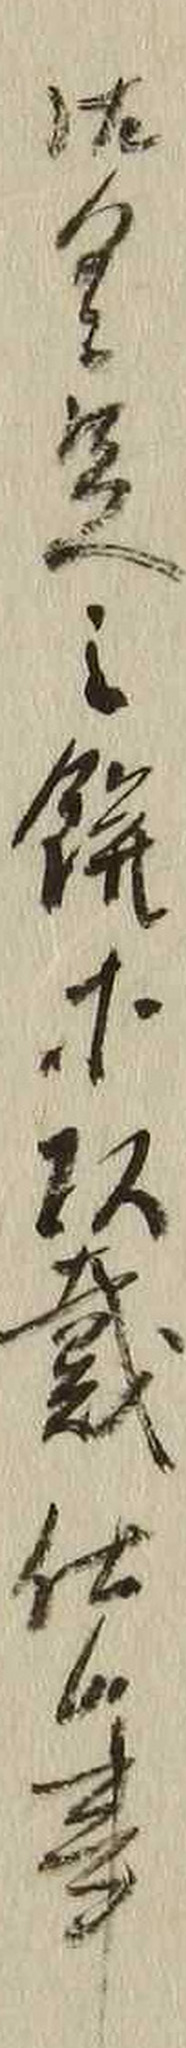御具足之餅等頂戴仕候事
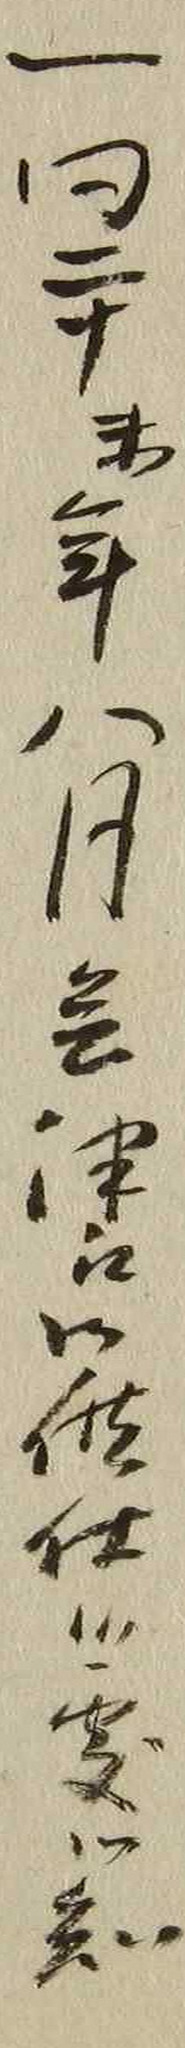一同二十未年八月会津江御供仕候処御知
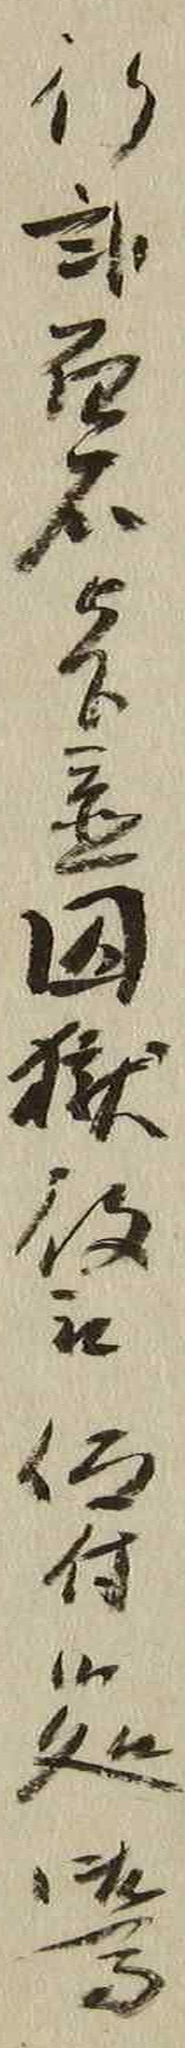行弐百石被下置囚獄役被仰付候処御馬
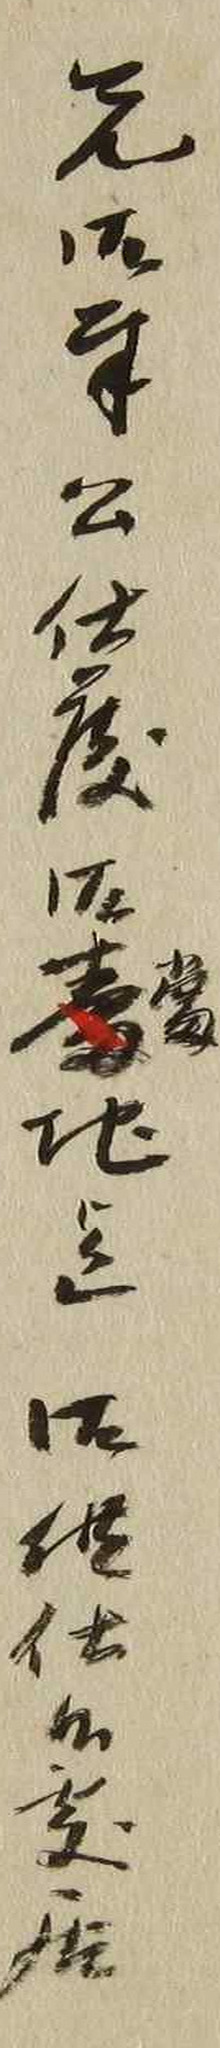元御奉公仕度御当地迄御供仕候処居
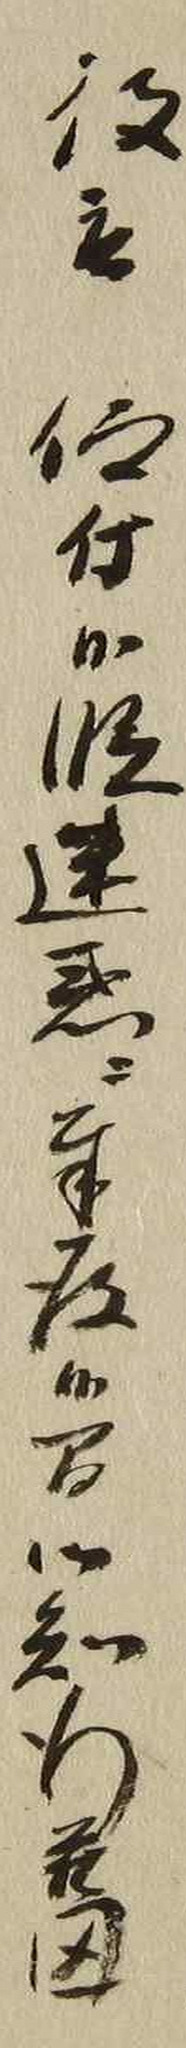役被仰付候段迷惑に奉存候間御知行并囚
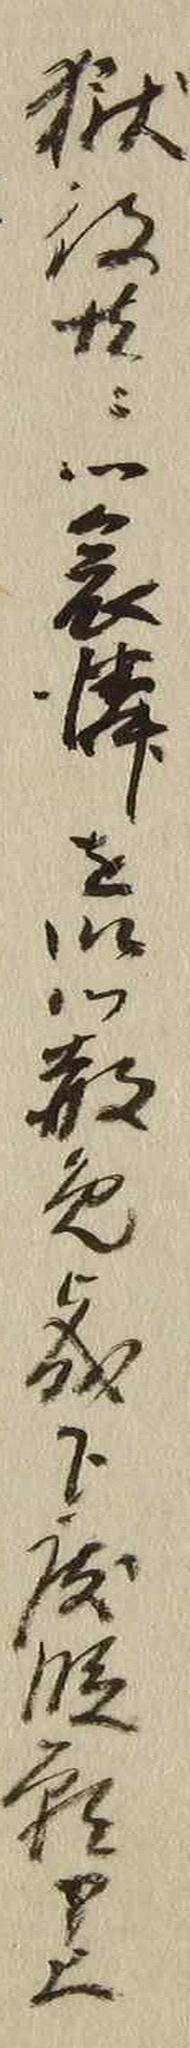獄役共に御哀憐を以御赦免被成下度段願申上
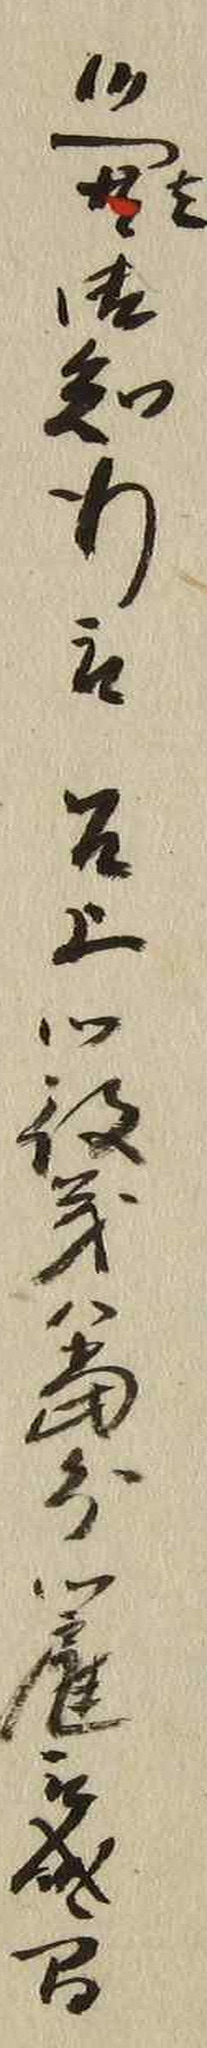候へ共御知行被召上御役義は当分御雇被成候間
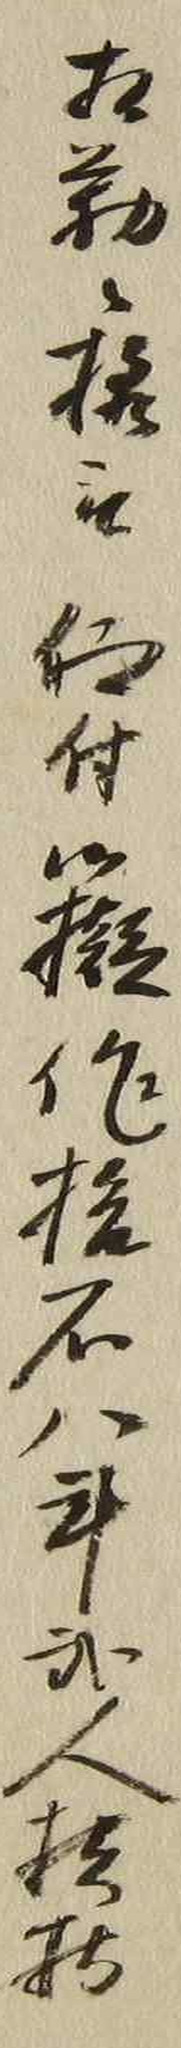相勤候様被仰付御擬作拾石八斗弐人扶持
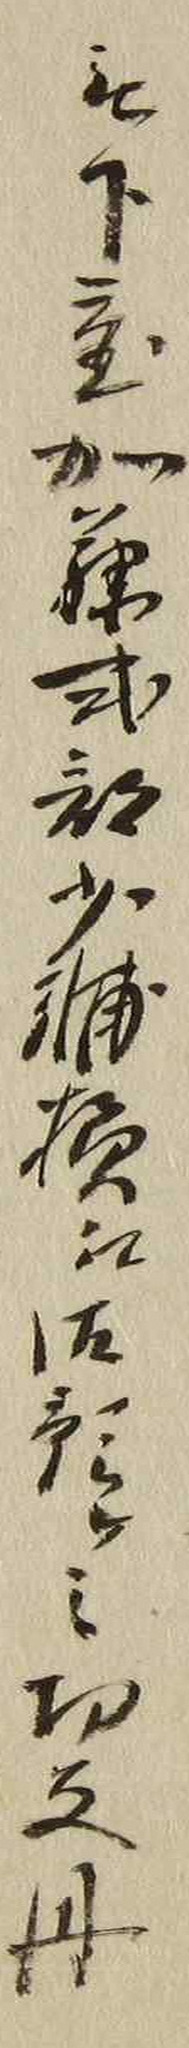被下置加藤式部少輔江御預之切支丹
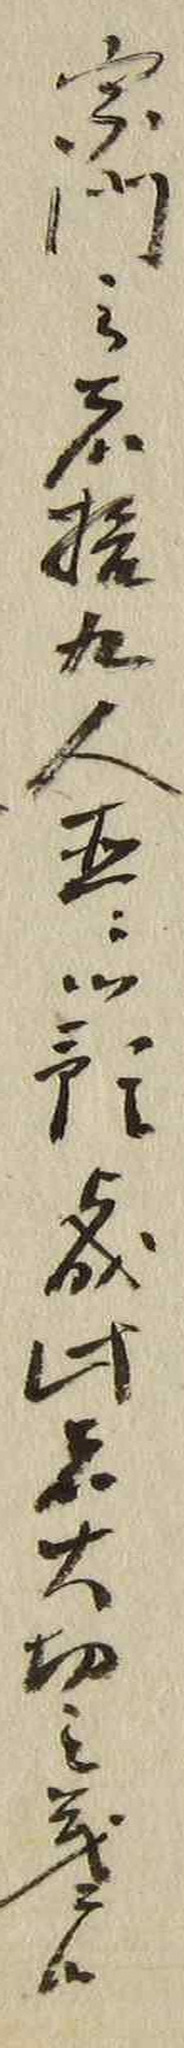宗門之者拾九人直々御預被成此者大切之義に候
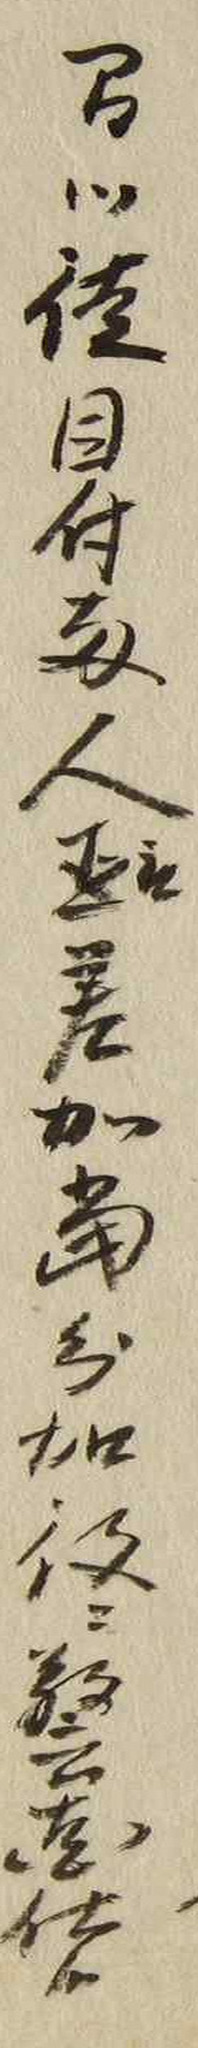間御徒目付両人被差加当分加役に警固仕候
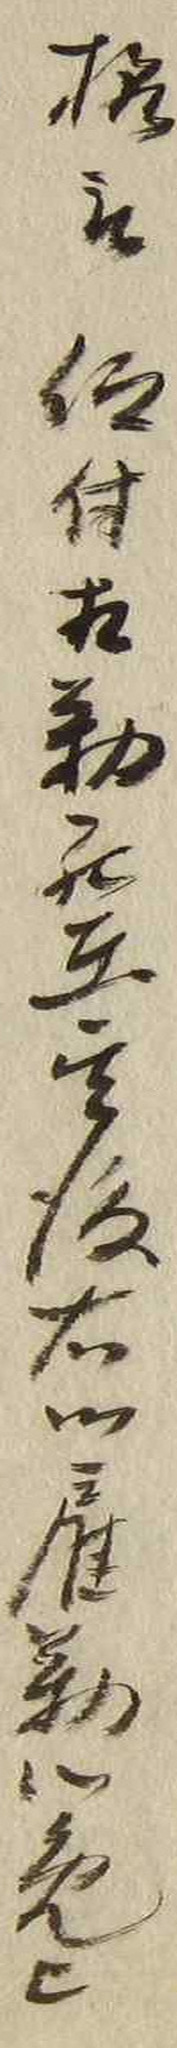様被仰付相勤罷在其後右御雇勤御免に

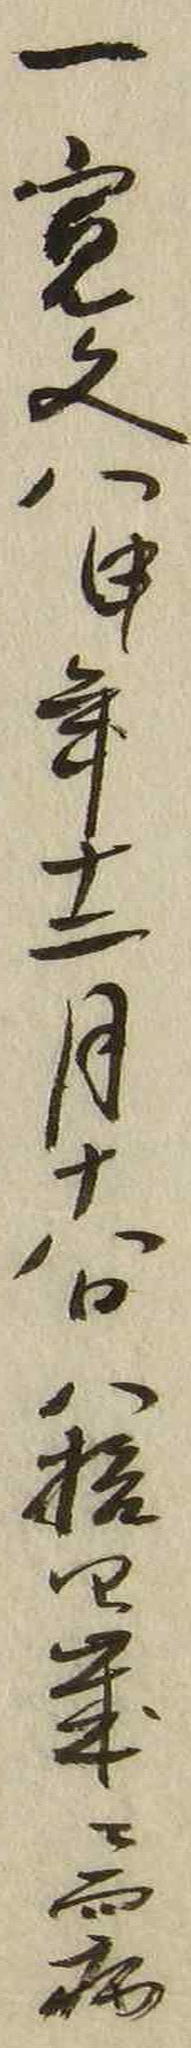一寛文八申年十二月十八日八拾四歳に而病
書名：諸士系譜　巻之360　す之部10
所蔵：会津若松市立会津図書館
